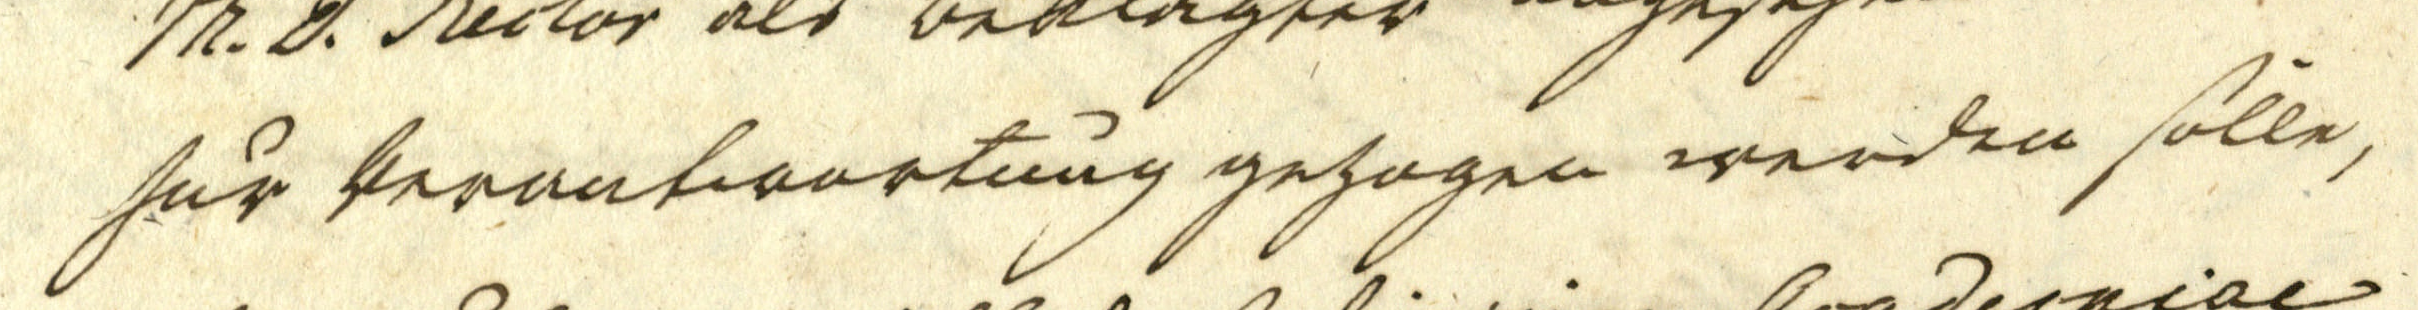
zur Verantwortung gezogen werden solle,
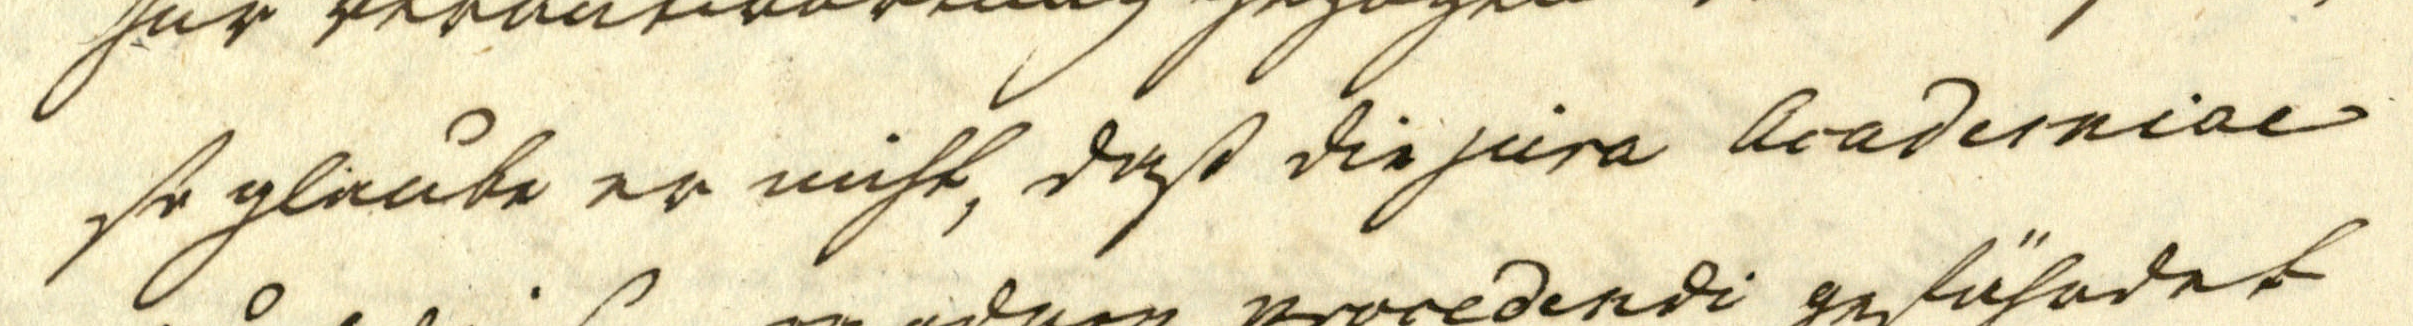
so glaube er nicht, daß die jura Academiae
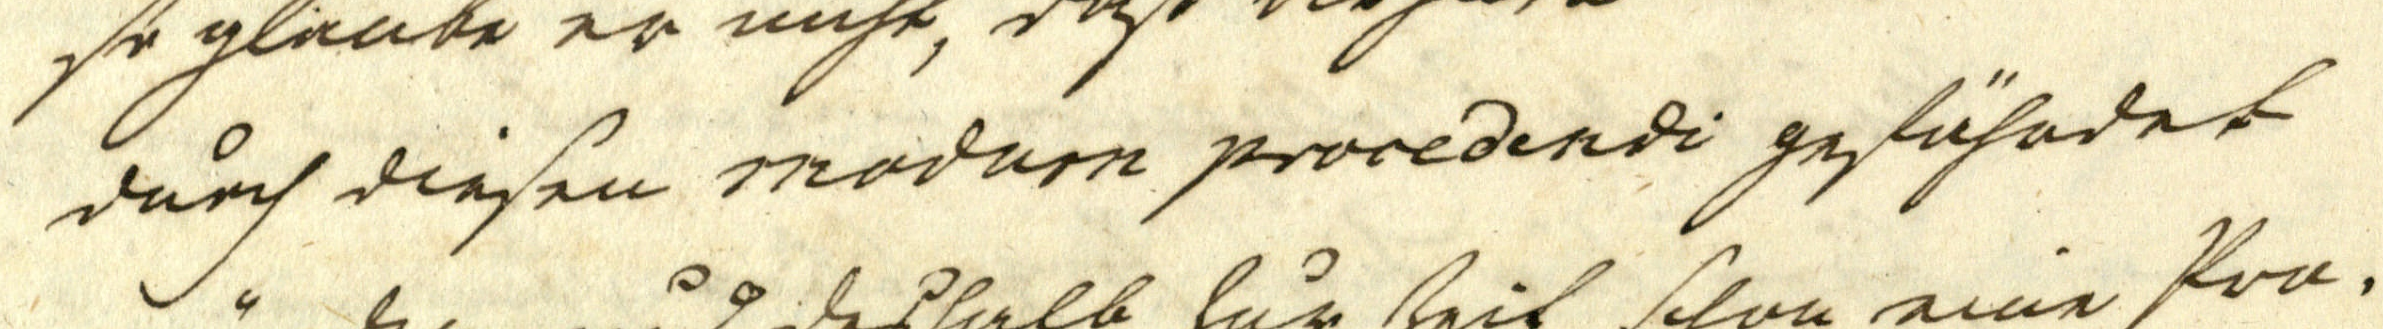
durch diesen modum procedendi gefährdet
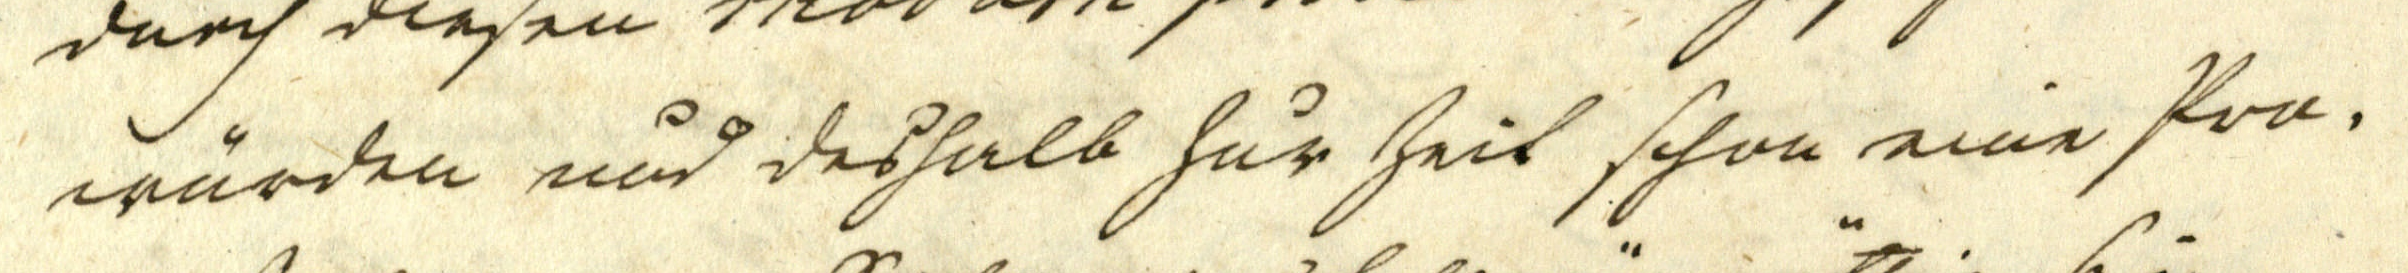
würden und deshalb zur Zeit schon eine Pro¬
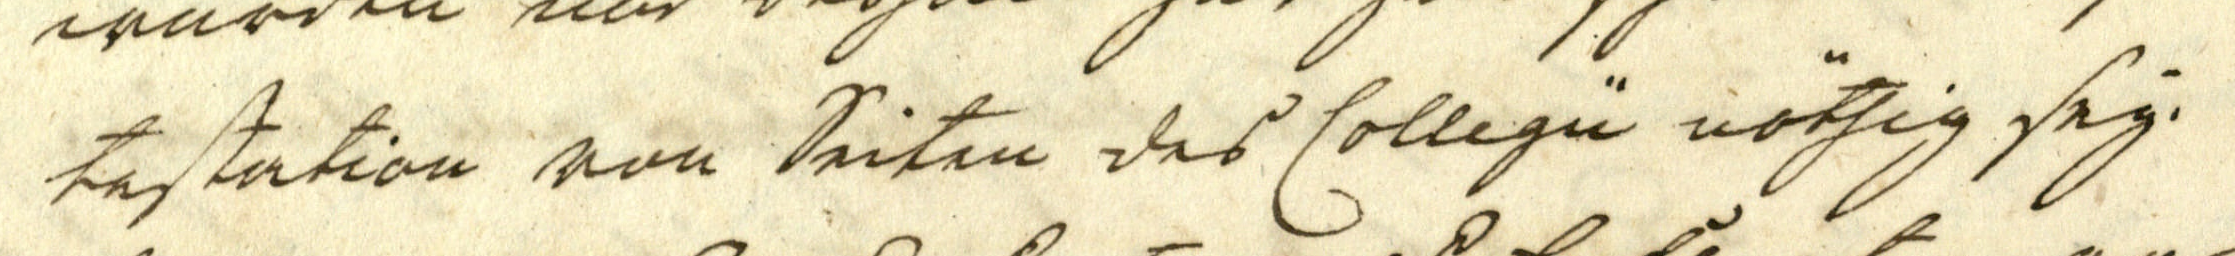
testation von Seiten des Collegii nöthig sey.
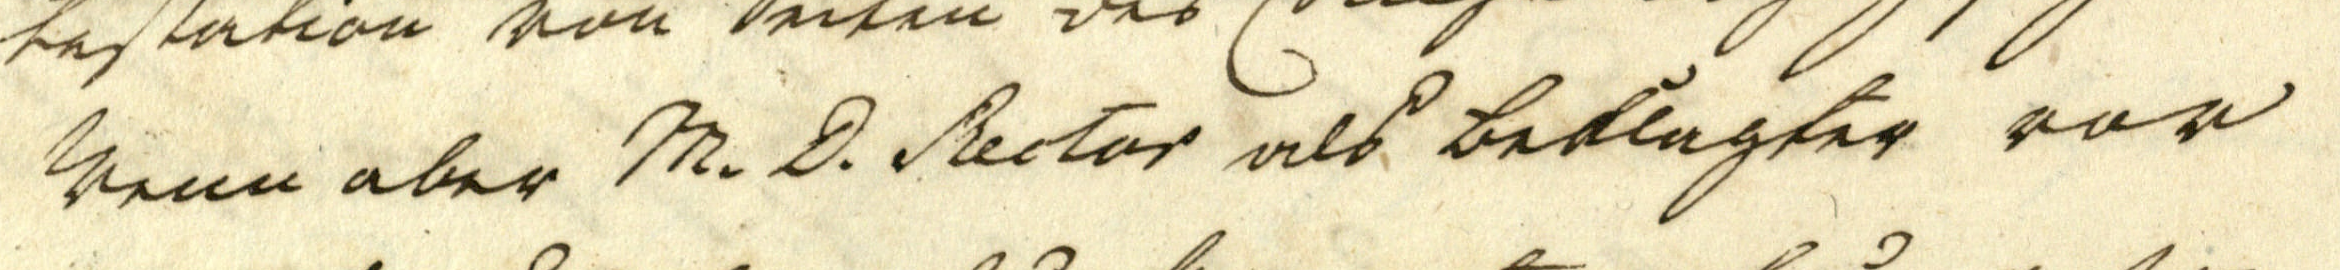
Wenn aber M. D. Rector als Beklagter vor
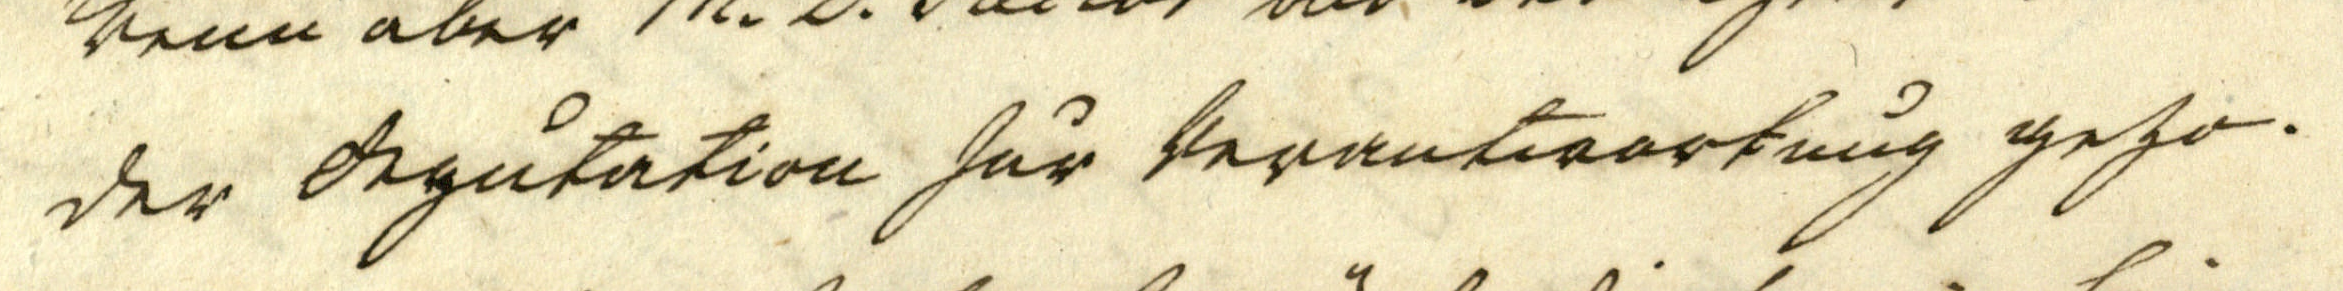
der Deputation zur Verantwortung gezo¬
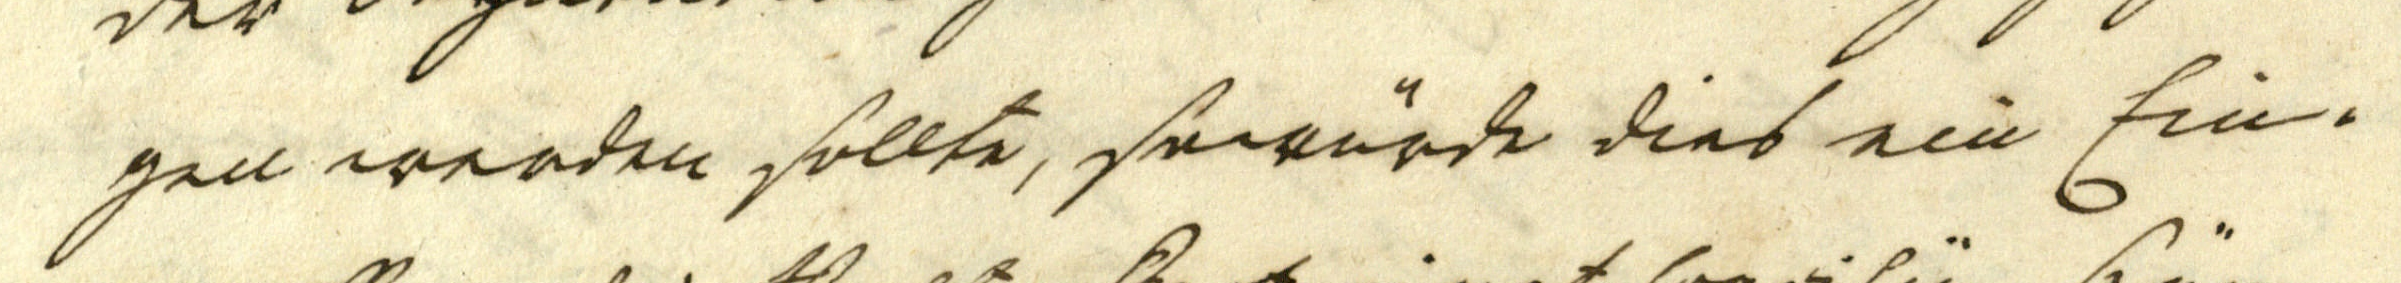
gen werden sollte, sowürde dies ein Ein¬
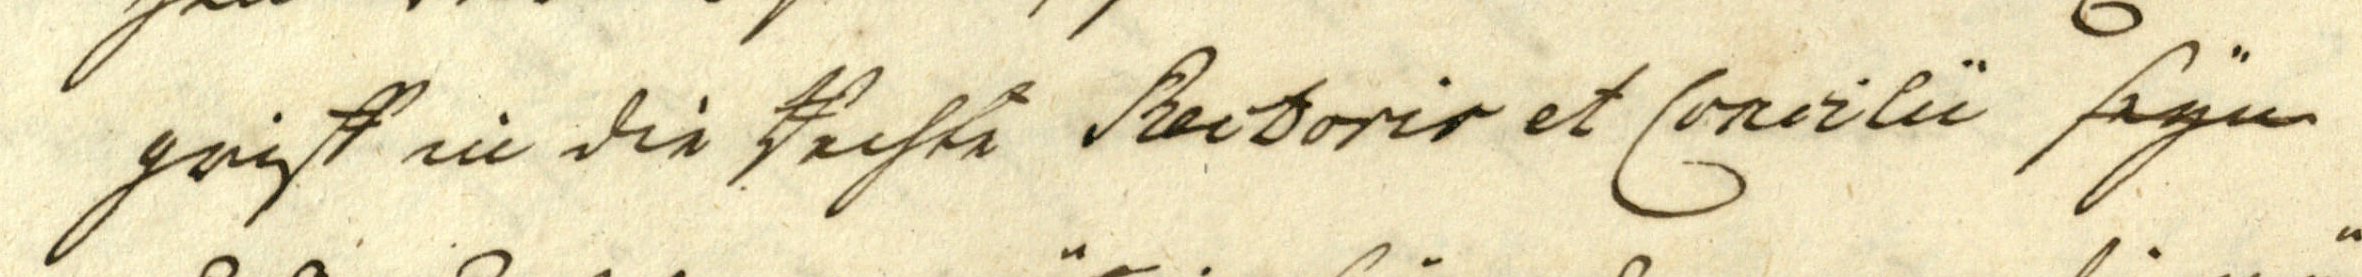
griff in die Rechte Rectoris et Concilii seÿn
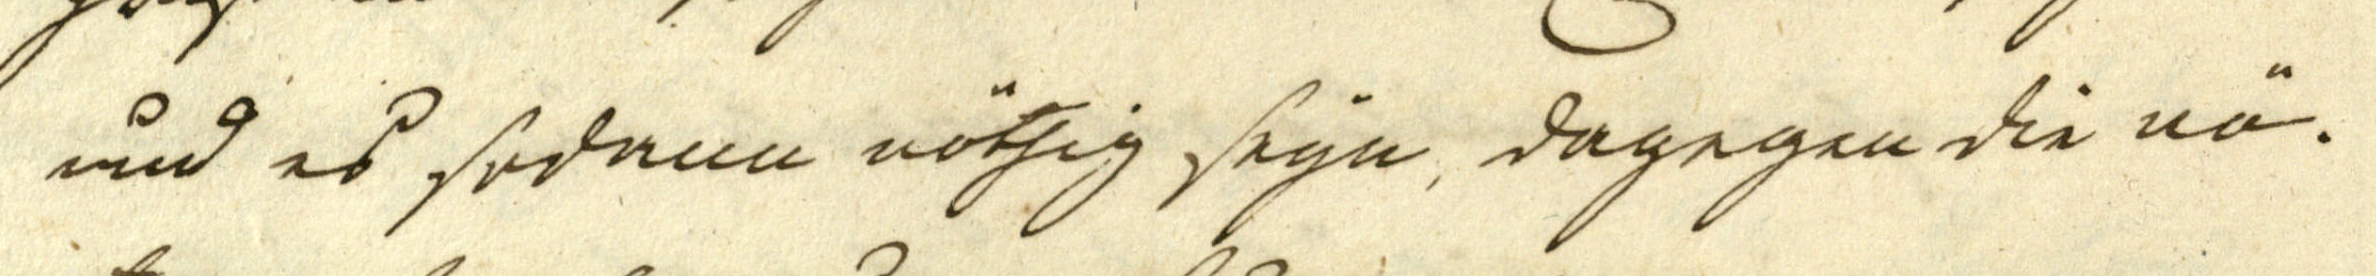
und es sodann nöthig seÿn, dagegen die nö¬
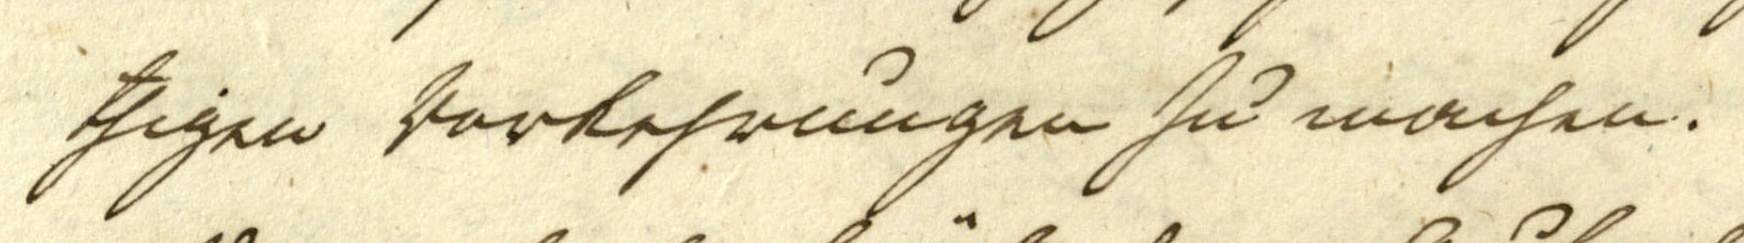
thigen Vorkehrungen zu machen.
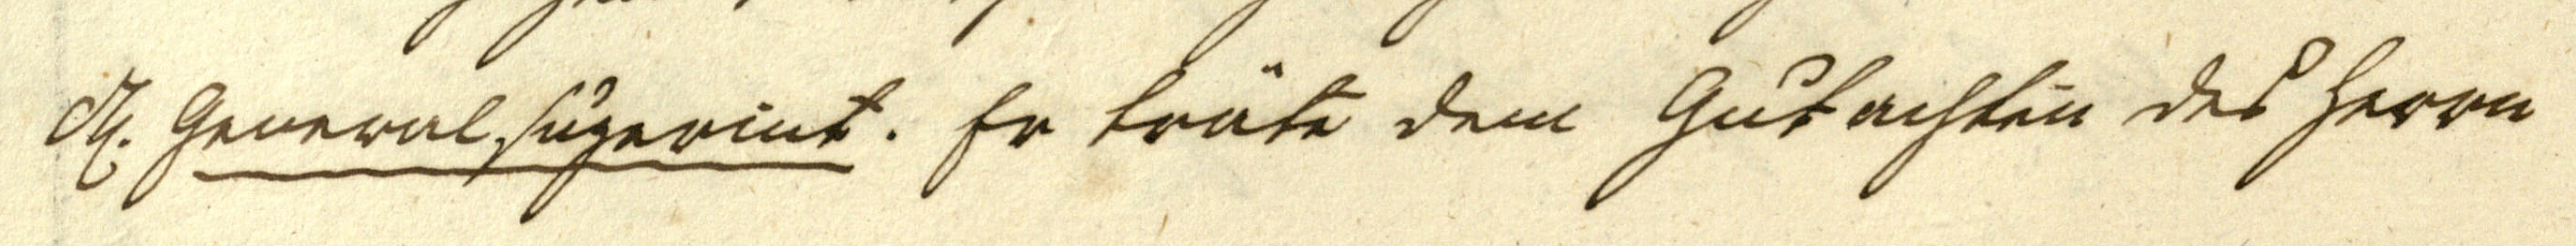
dh. Generalsuperint. Er träte dem Gutachten des Herrn
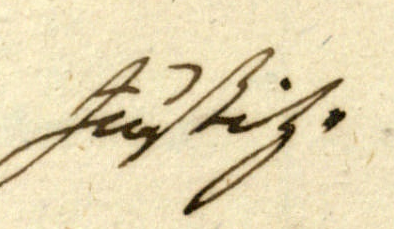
Justiz.
